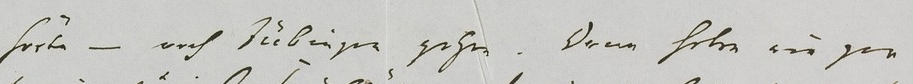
hörte – nach Tübingen gehen. Dann haben wir gar
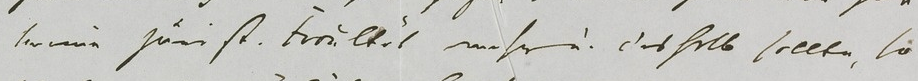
keine jurist. Facultät mehr u. deshalb sollte, so
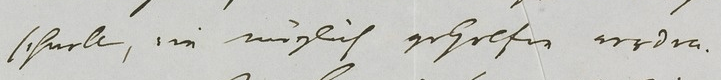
schnell, wie möglich geholfen werden.
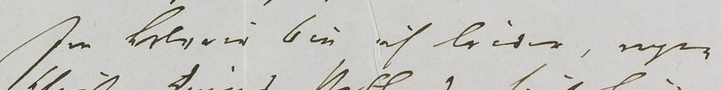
Im Belvoir bin ich leider, wegen
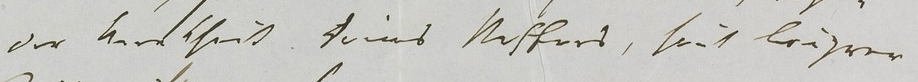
der Krankheit Deines Neffens, seit längrer
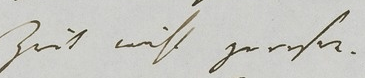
Zeit nicht gewesen.
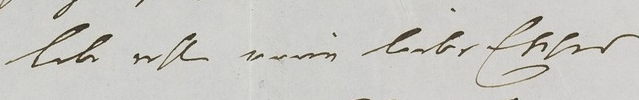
Lebe wohl mein lieber Escher
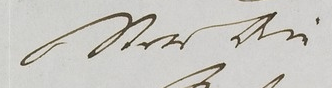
Stets Dein
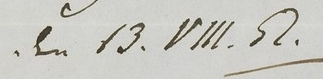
den 13. VIII. 52.
